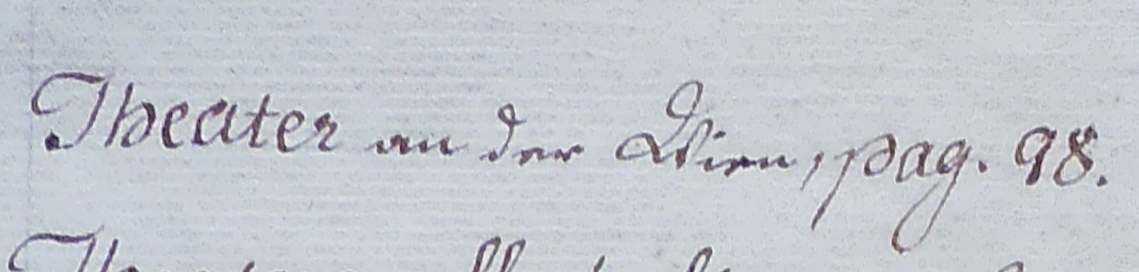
Theater an der Wien, pag. 98.
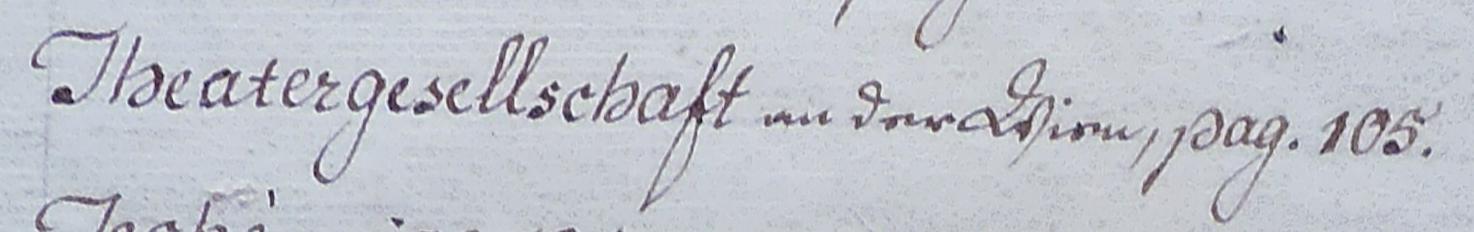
Theatergesellschaft an der Wien, pag. 105.
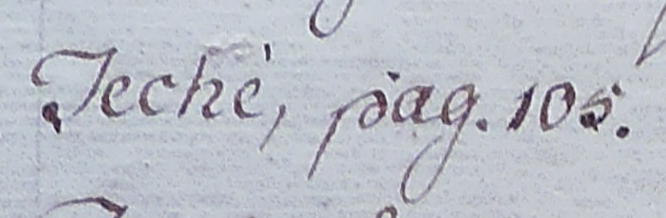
Techè, pag. 105.
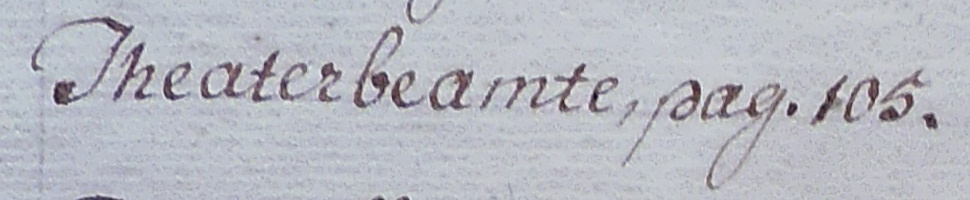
Theaterbeamte, pag. 105.
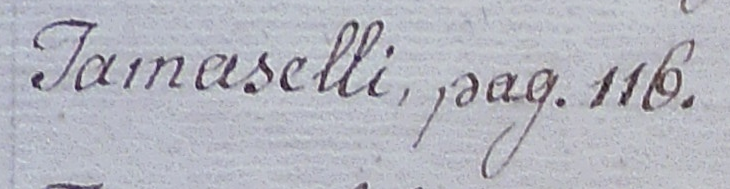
Tamaselli, pag. 116.
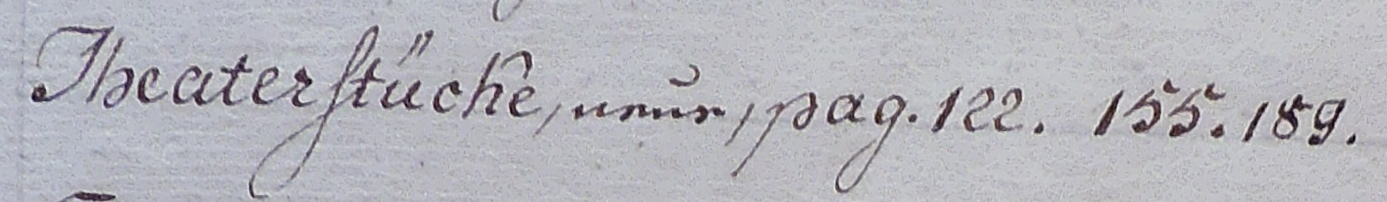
Theaterstücke, neue, pag. 122. 155. 189.
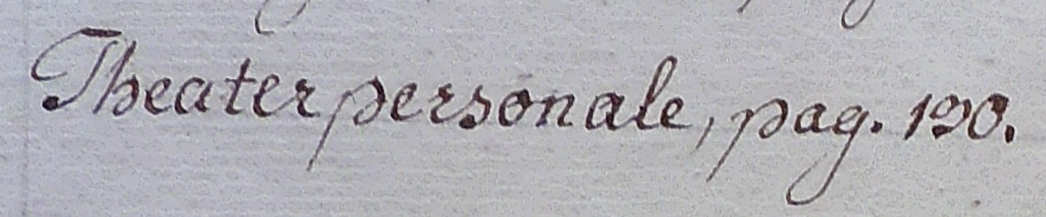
Theaterpersonale, pag. 130.
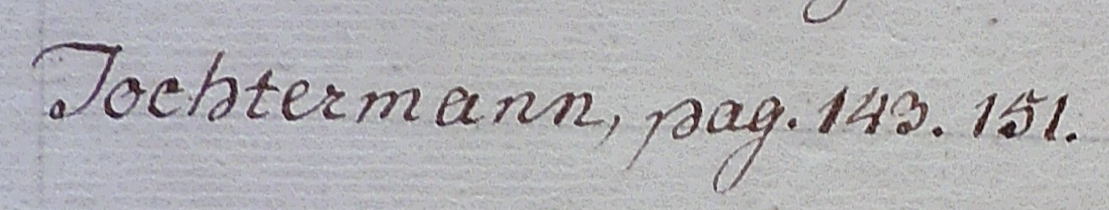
Tochtermann, pag. 143. 151.
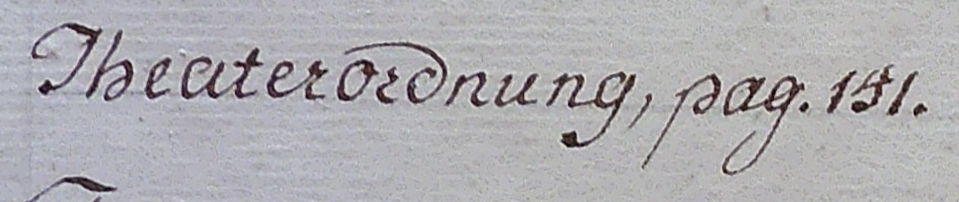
Theaterordnung, pag. 151.
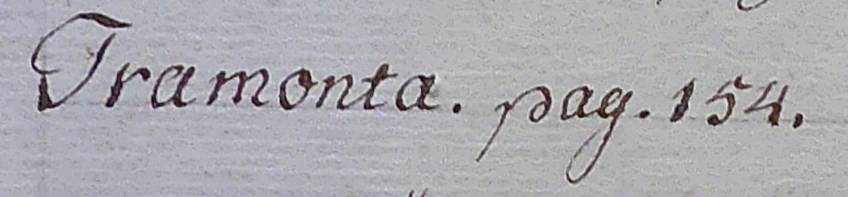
Tramonta. pag. 154.
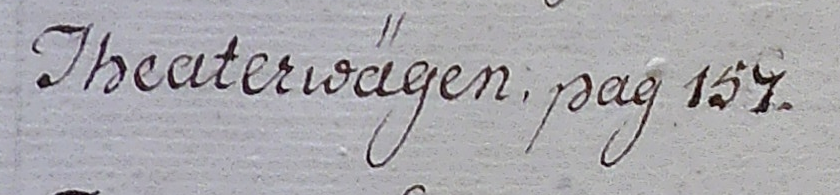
Theaterwägen, pag. 157.
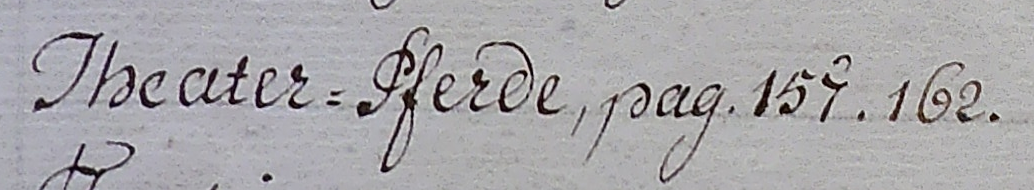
Theater=Pferde, pag. 157. 162.
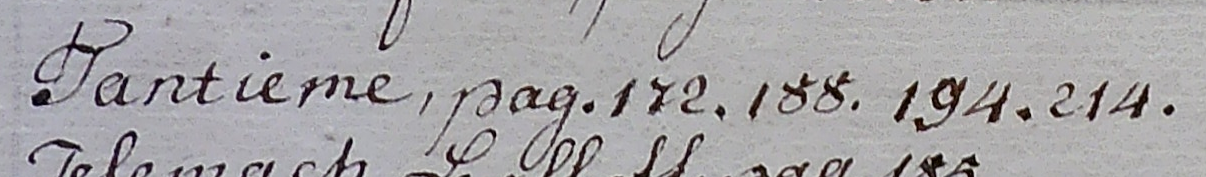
Tantieme, pag. 172. 188. 194. 214.
